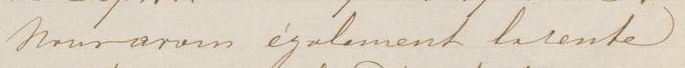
Nous avons également la rente
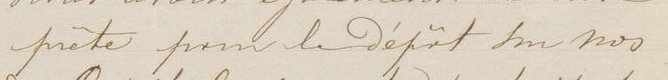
prête pour le dépôt sur nos
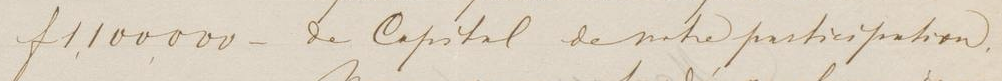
f 1,100,000– de Capital de notre participation.
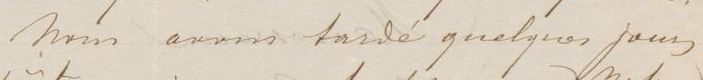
Nous avons tardé quelques jours
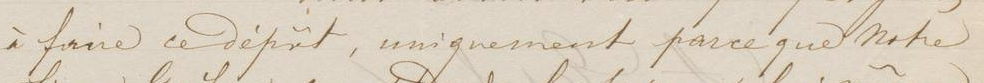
à faire ce dépôt, uniquement parce que notre
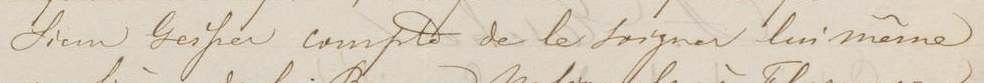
Sieur Geisser compte de le soigner lui même
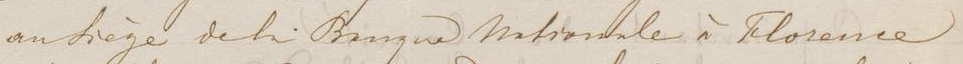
au siège de la Banque Nationale à Florence
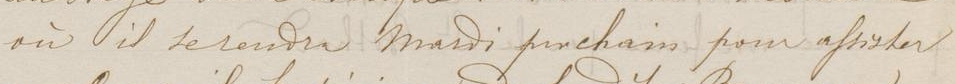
où il se rendra Mardi prochain pour assister
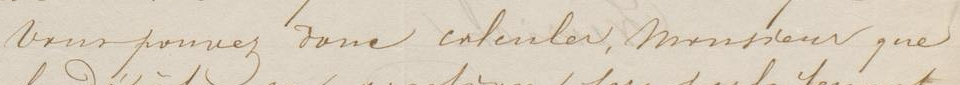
vous pouvez donc calculer, Monsieur que
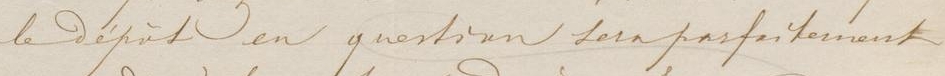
le dépôt en question sera parfaitement
